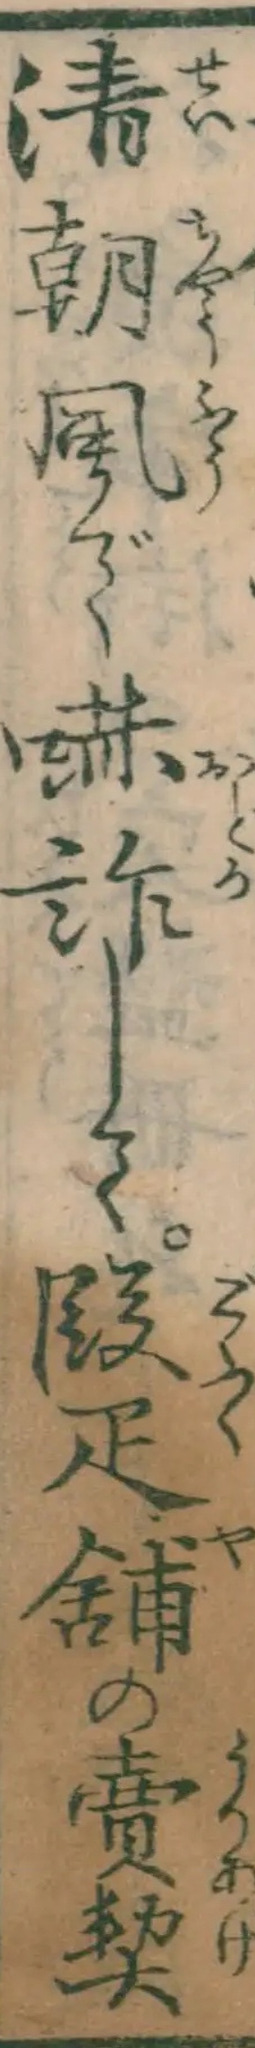清朝風で嚇詐して。段疋舗の売契

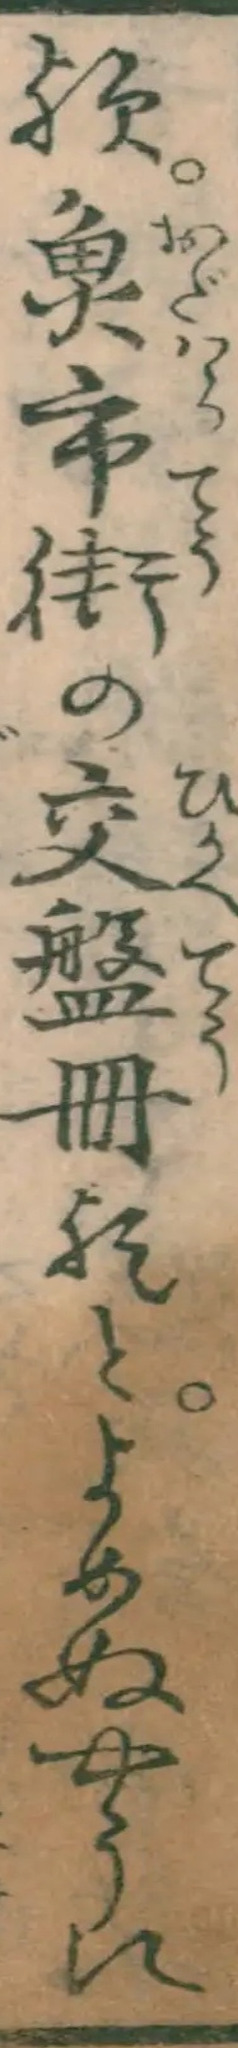歟。魚市街の交盤冊歟と。よめぬやうに
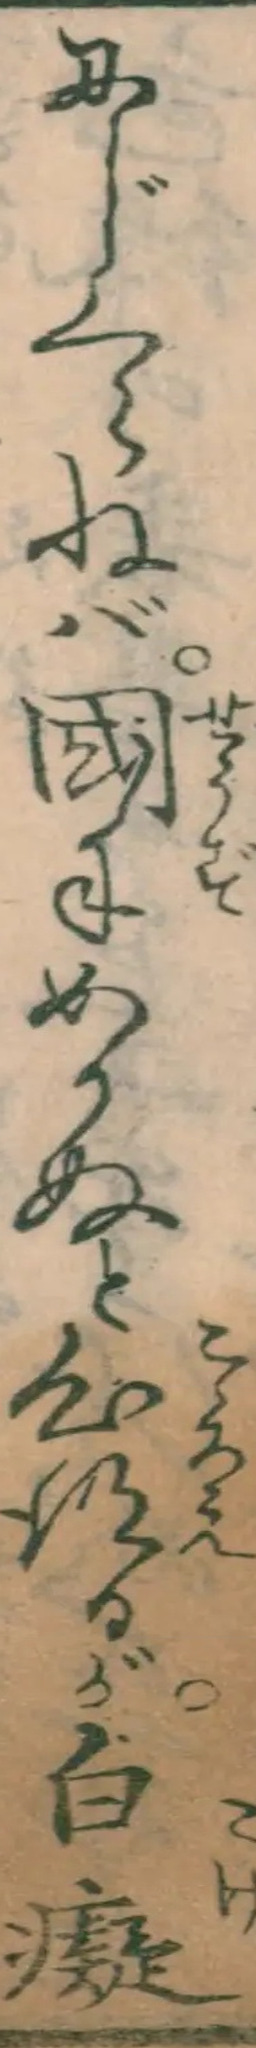にじくらねば。国手めりぬと心得るが。白癡
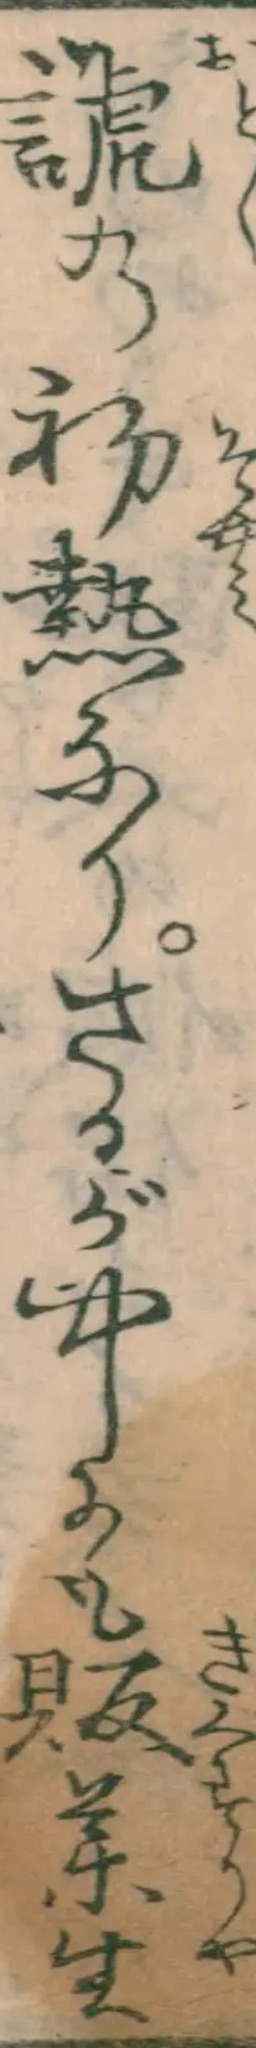諕の初熱なり。さるが中にも販茶生。
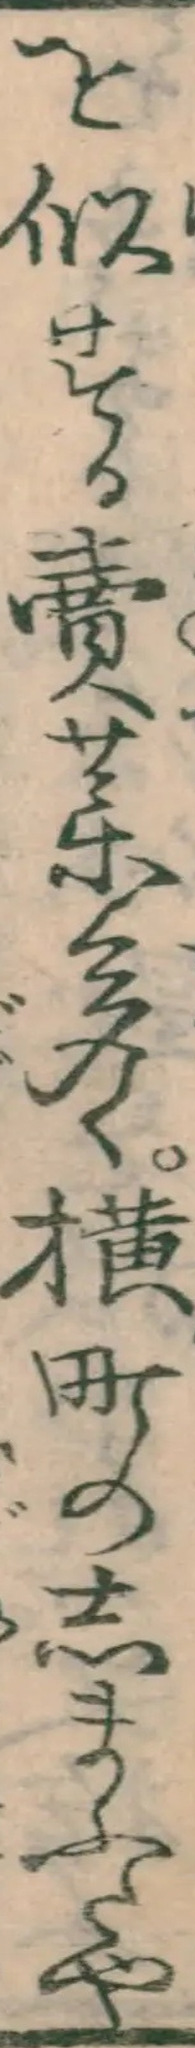を似する売茶多く。横町のしまふたや。
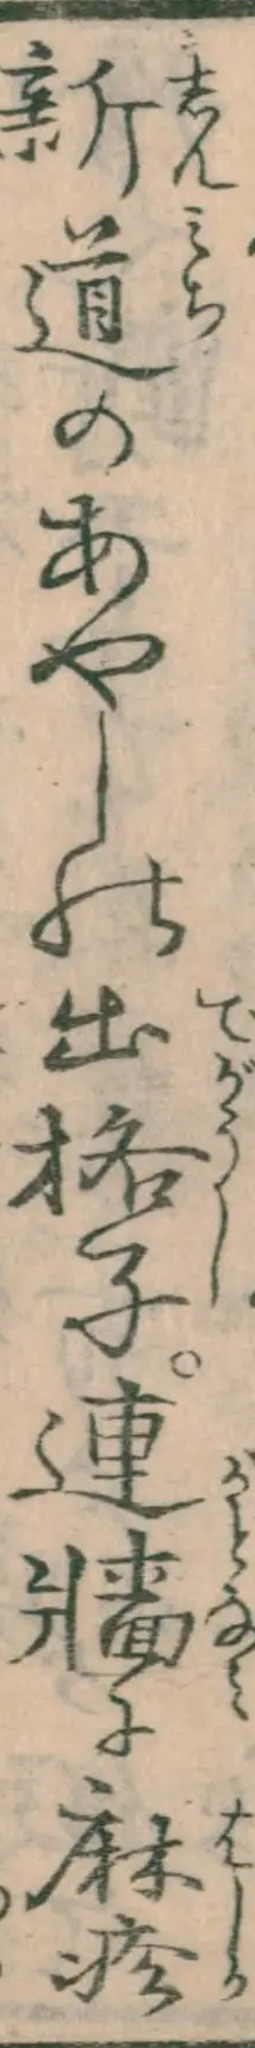新道のあやしの出格子。連牆に麻疹
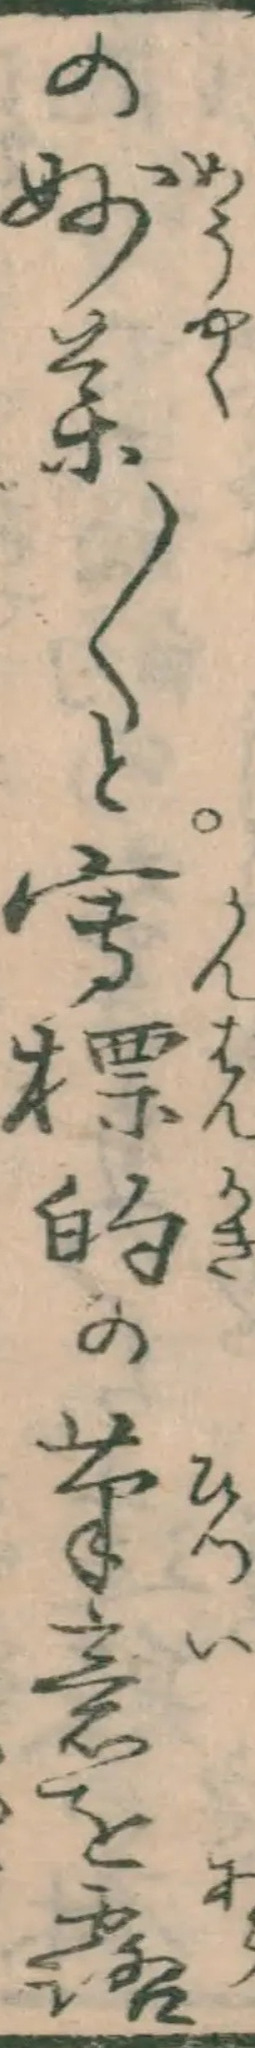の妙薬〳〵と。標的の筆意を露
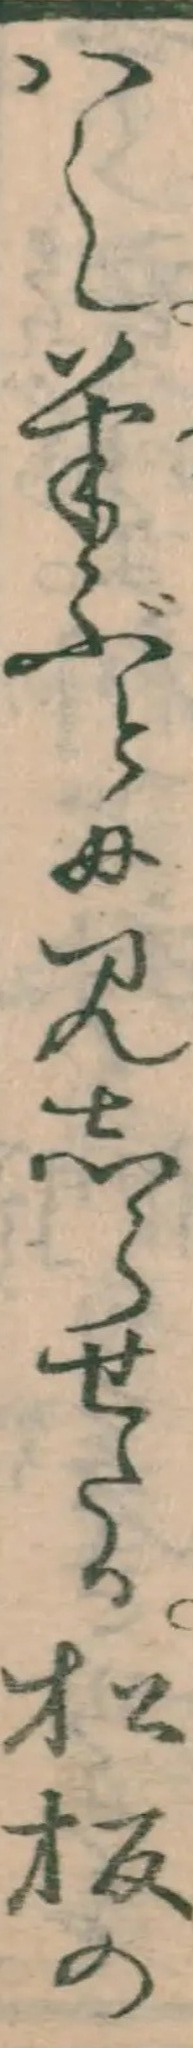はし。筆ぶとに見しらせたる。松板の
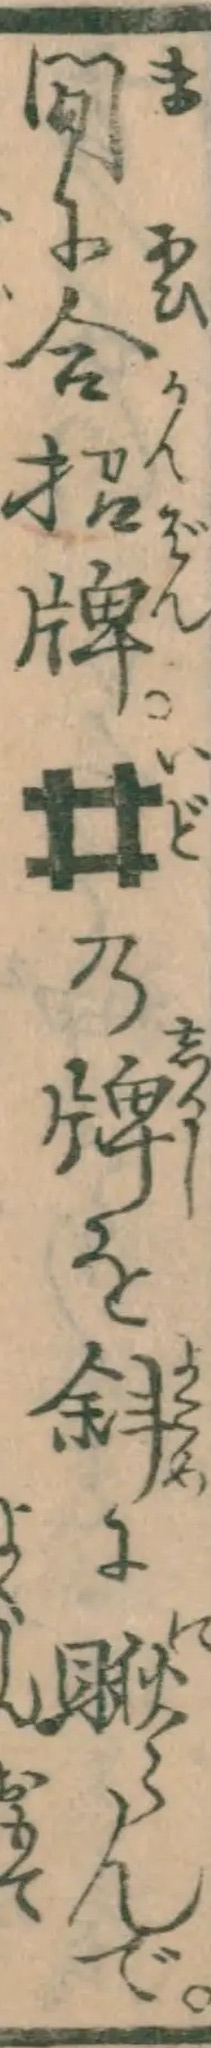間に合招牌。の牌を斜に瞅らんで。
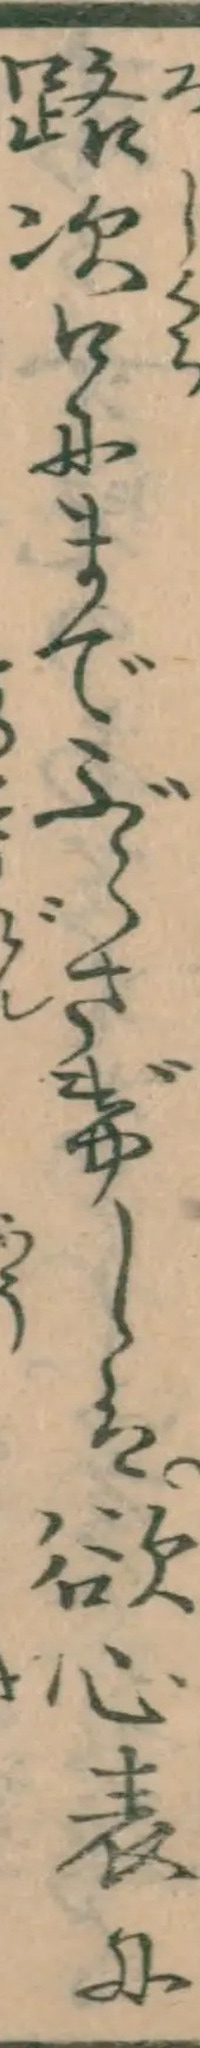路次口にまでぶらさげしは。欲心表に
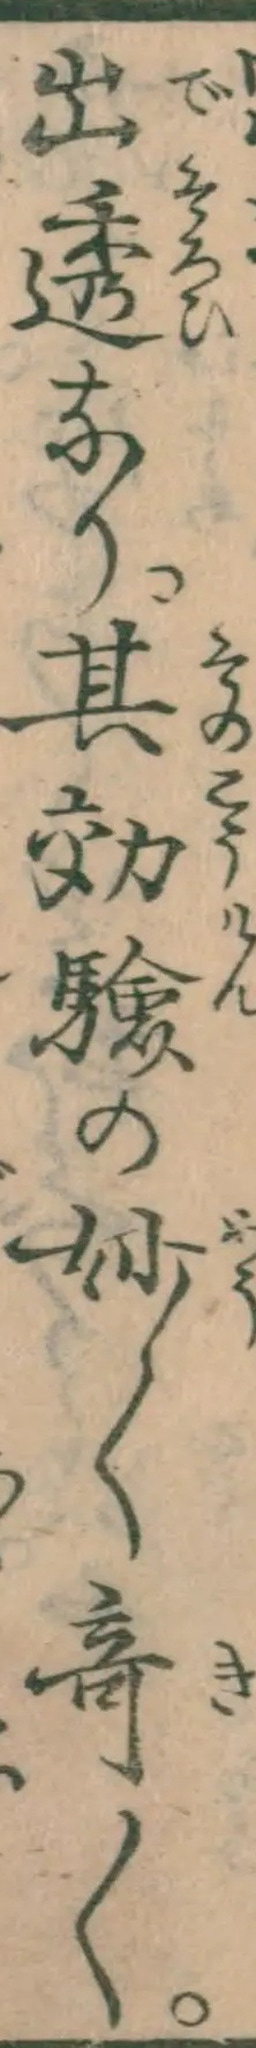出透なり。其効験の妙々奇々。
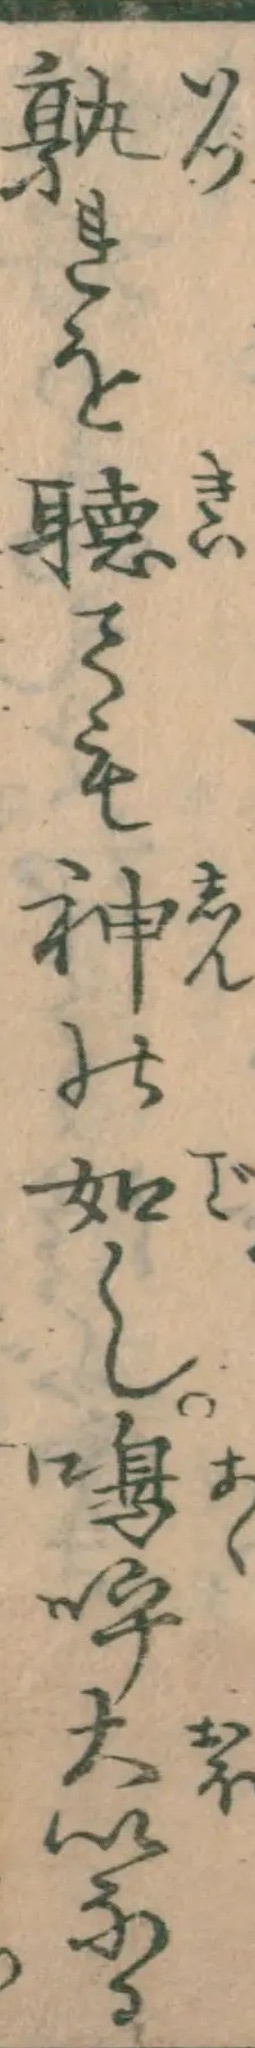孰れを聴ても神の如し。鳴呼大いなる
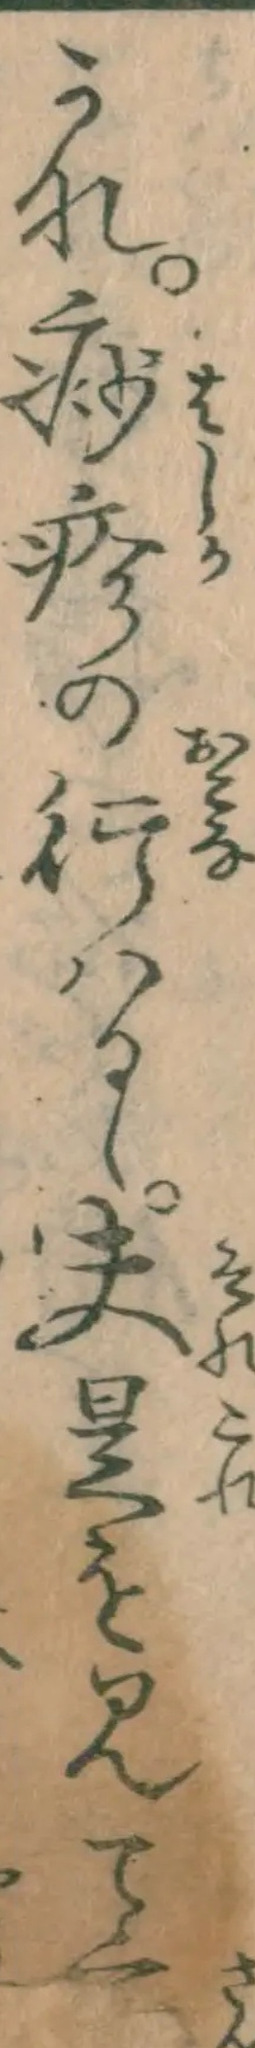かな。痧疹の行はるゝ。夫是を見て察
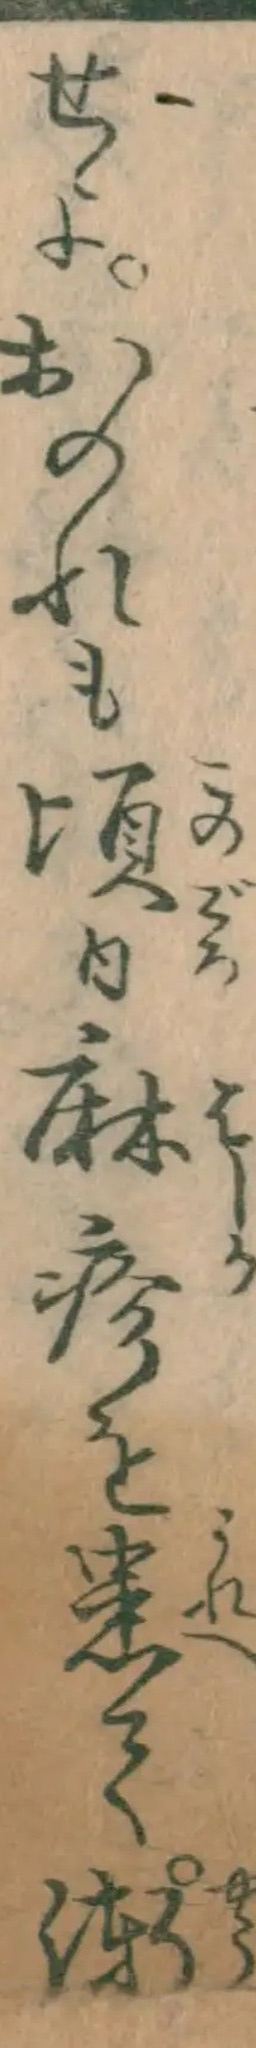せよ。おのれも頃日麻疹を患て。漸く
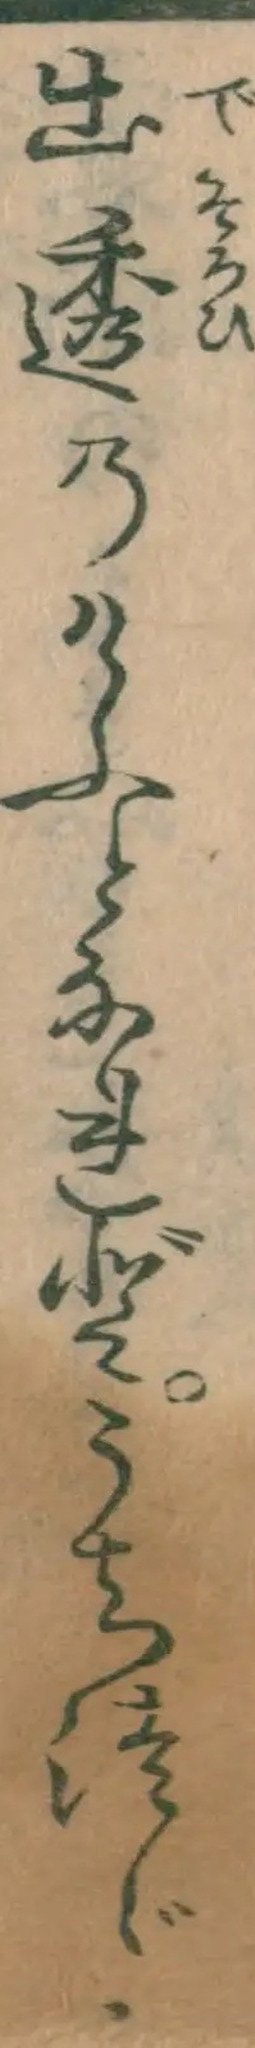出透のけふとなれど。うちつゞく

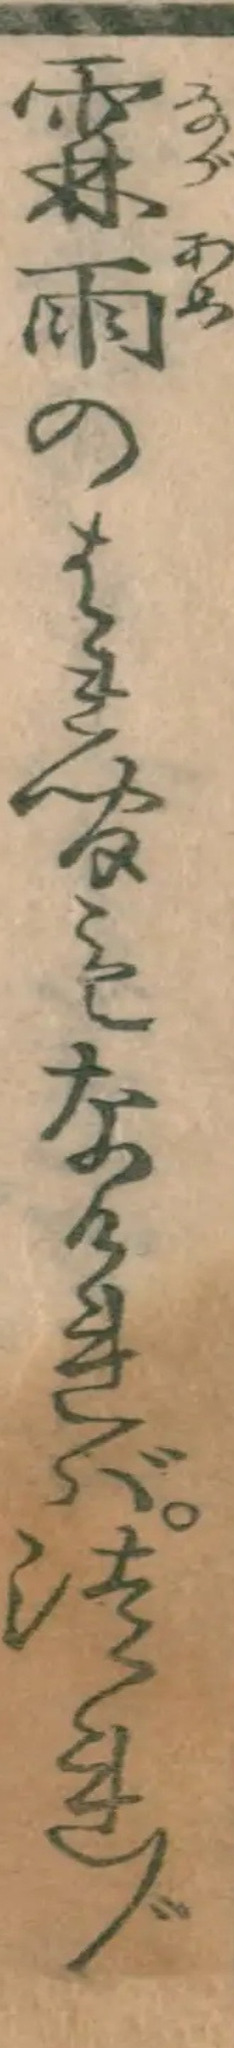霖雨のはれ間もなければ。つれ〴〵
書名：麻疹戯言
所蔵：国立国会図書館 National Diet Library, JAPAN
